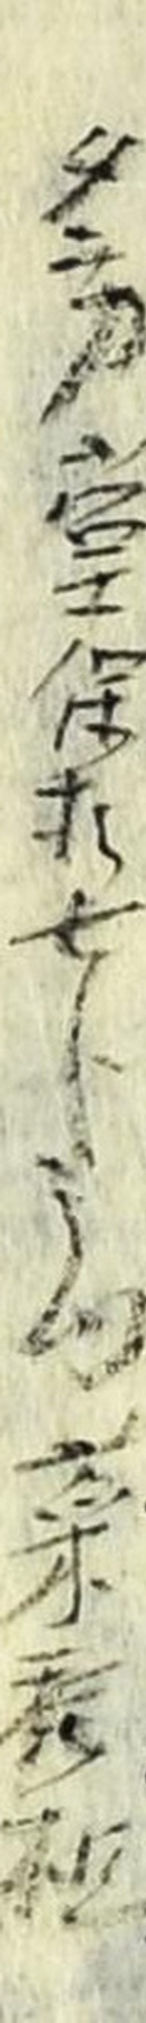夕方堂保拾七歩之内菜種植
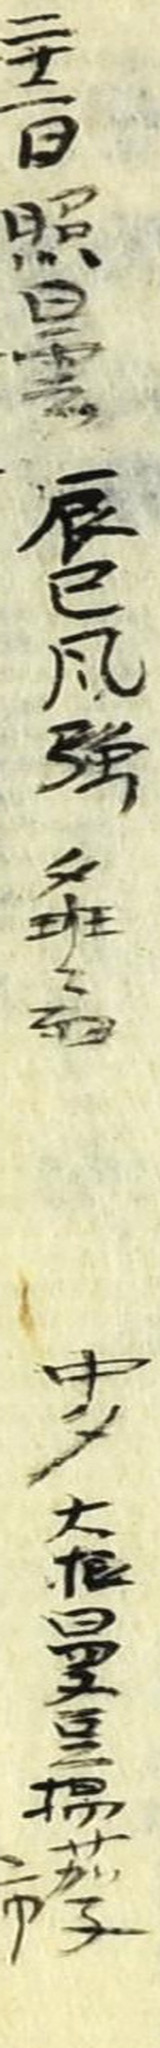二十二日照曇辰巳風強夕班々雨中夕大根曼豆揚茄子柿
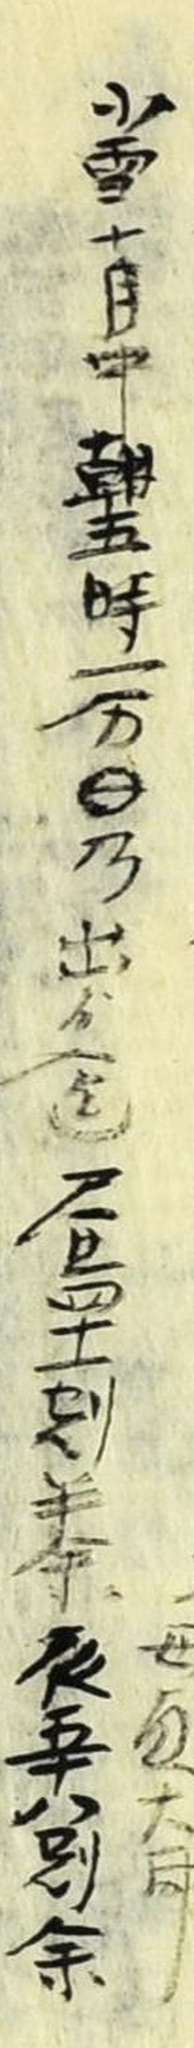小雪十月中朝五時一分日乃出ゟ入迄昼四十一刻半余五十八刻半余
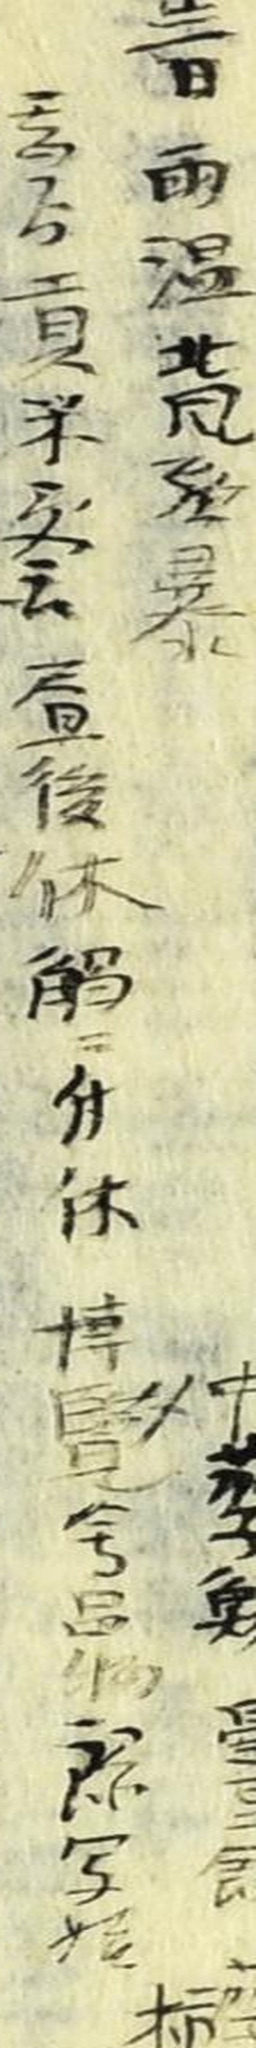甚右衛門貢米受取昼後休触ニ付休博覧会品物録写始
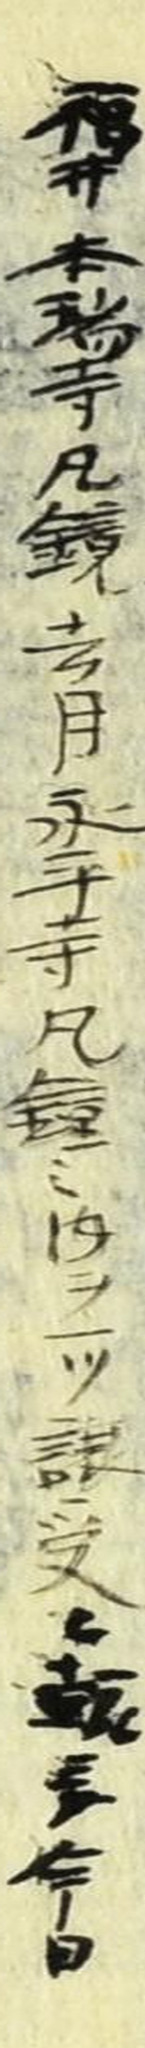福井本瑞寺梵鏡去月永平寺梵鐘之内ヲ一ツ譲受候趣ニテ今日
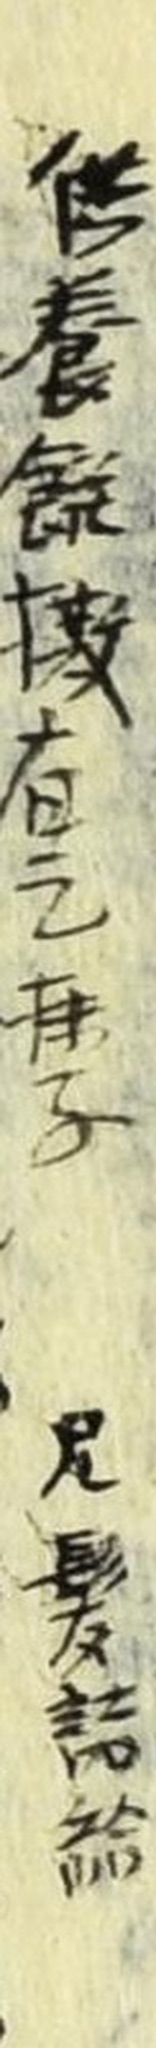供養餅撒有之様子兄髪詰給
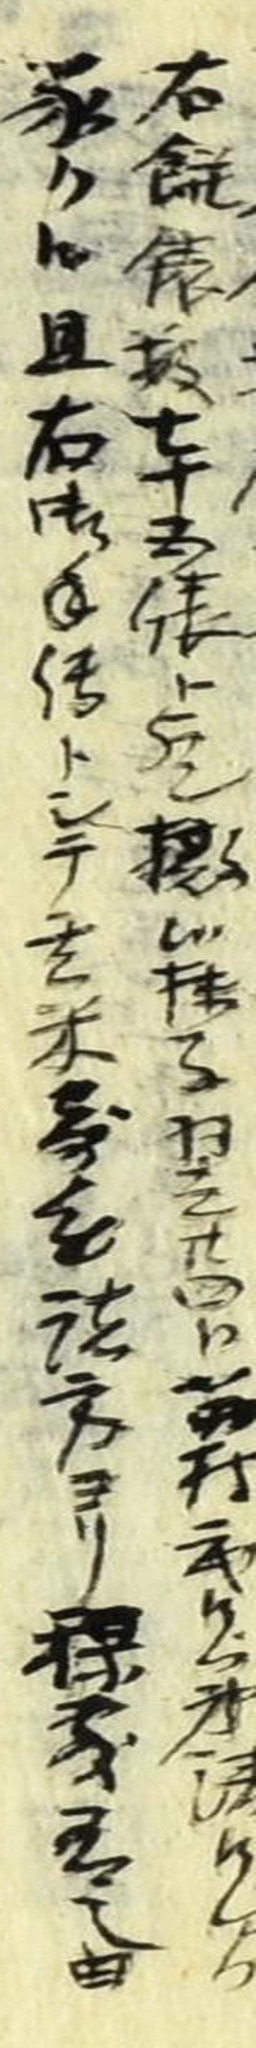承リ候且右御手伝トシテ玄米寄進諸方ヨリ禄敷有之由
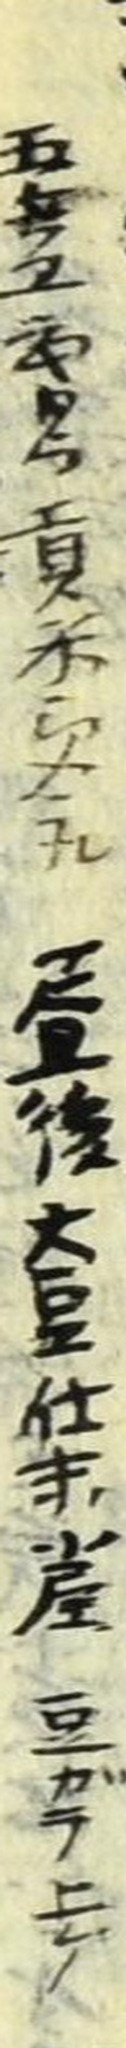五兵ヱ武左衛門貢米受取昼後大豆仕末小屋豆ガラ上ケ
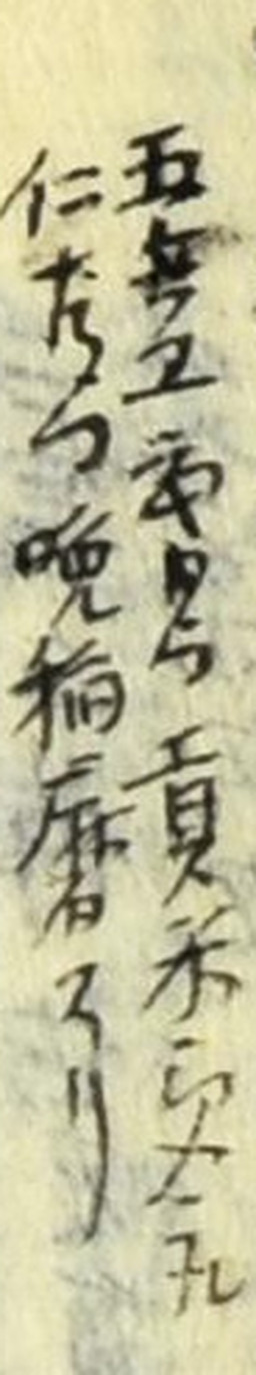仁左衛門晩稲磨スリ
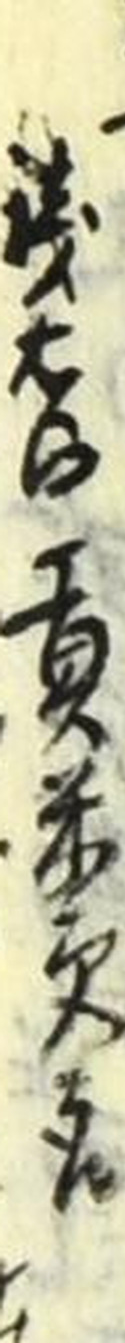浅右衛門貢米受取
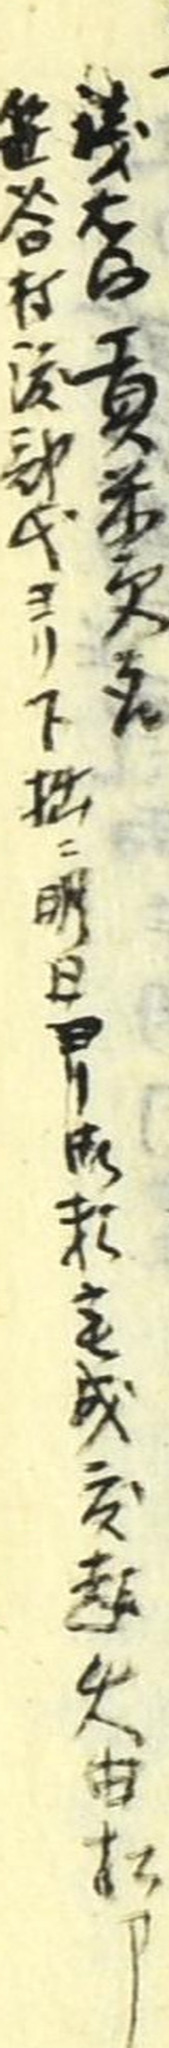笹谷村渡部氏ヨリ下拙ニ明日ヨリ御頼宅被成度趣使由松申

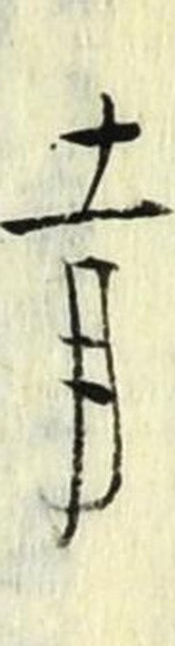十一月
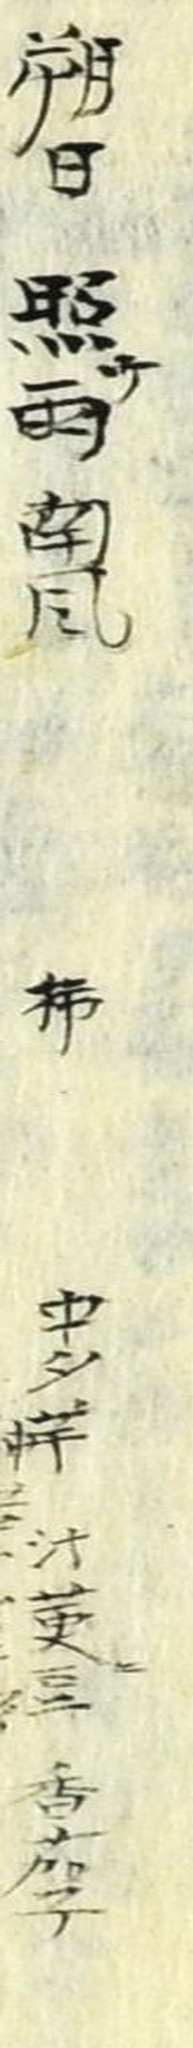朔日照少雨南風柿中夕芋汁荑ニ豆香茄子
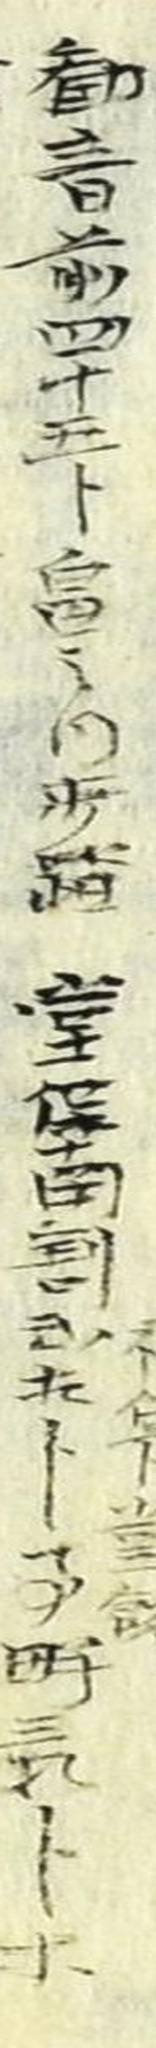勧音前四十五歩畠之内歩踏堂保南割弐拾歩事畔三拾歩等
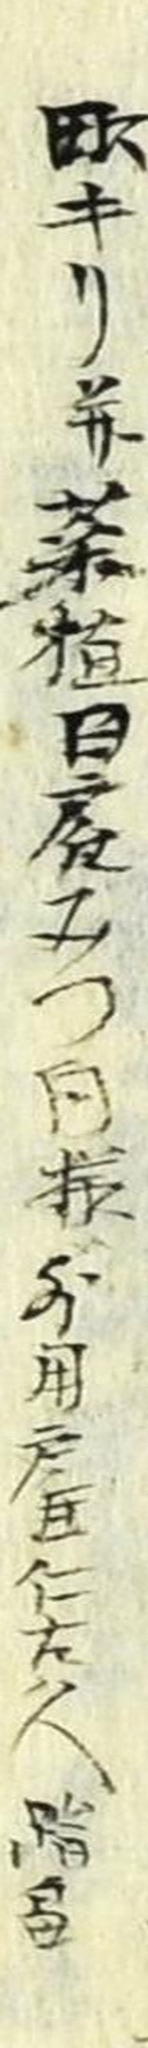畝キリ幷菜植日雇みつ同様外用雇仁左久踏畠
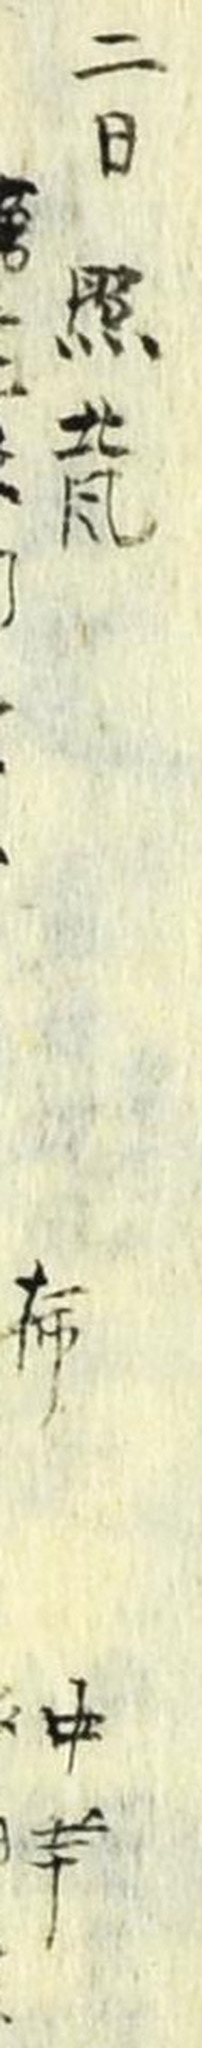二日照北風柿中芋
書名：（日記）
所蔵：福井県文書館 Fukui Prefectural Archives
